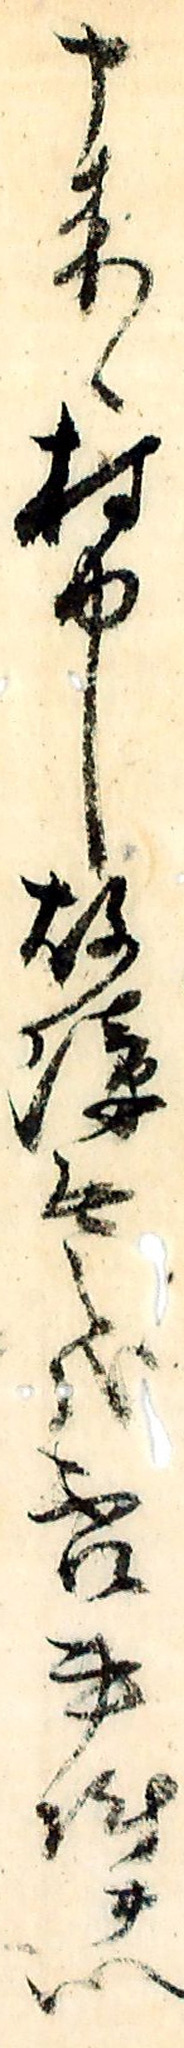申来候村中故障無之哉否書附を以
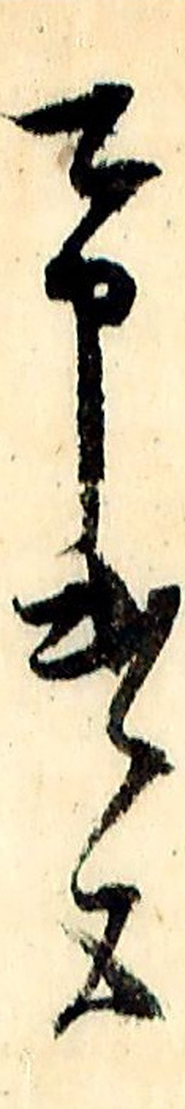可申出候以上
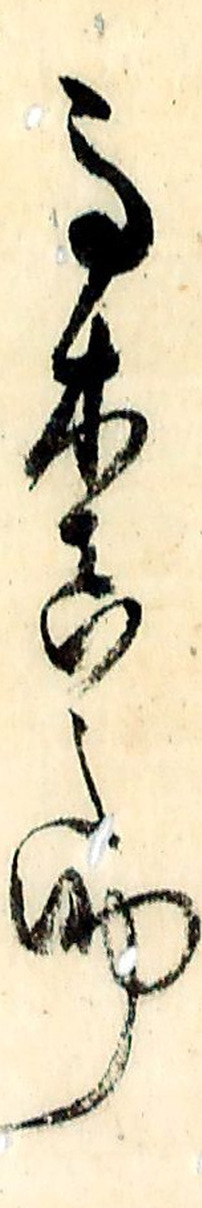高木真之助
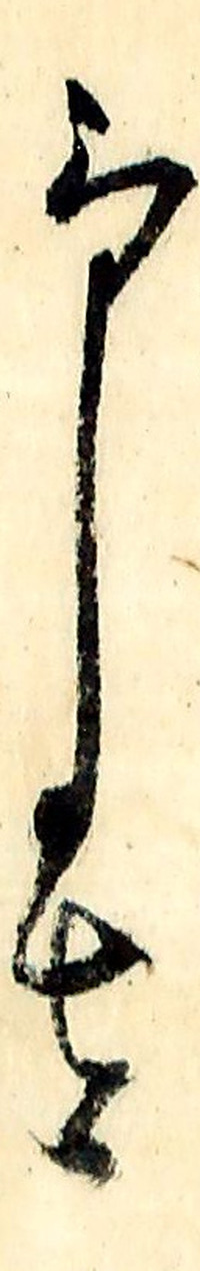三月七日
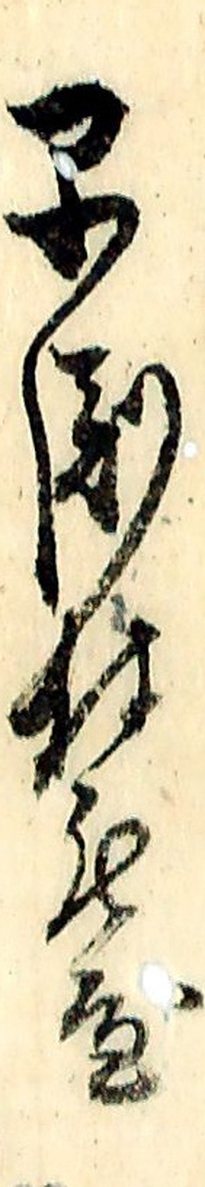早淵村庄屋
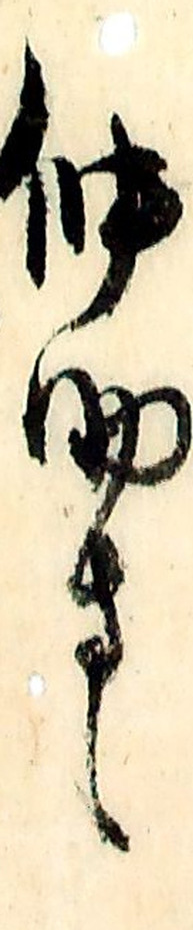仲助方へ
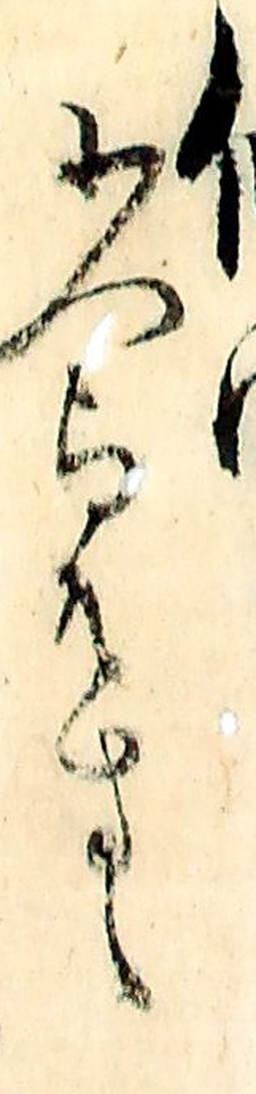五人与頭方へ
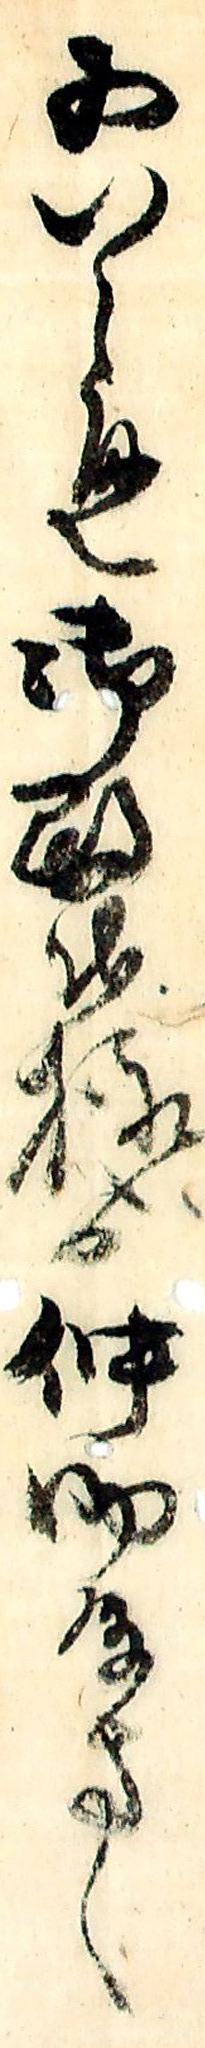右之通御郡代様ゟ仲助殿方へ
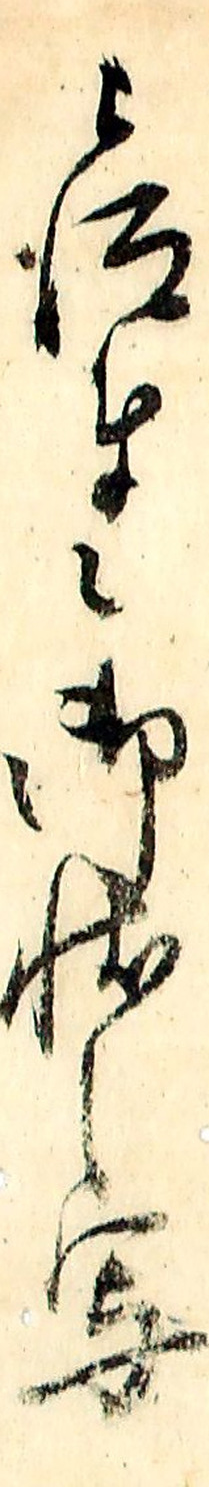被仰付候御状之写
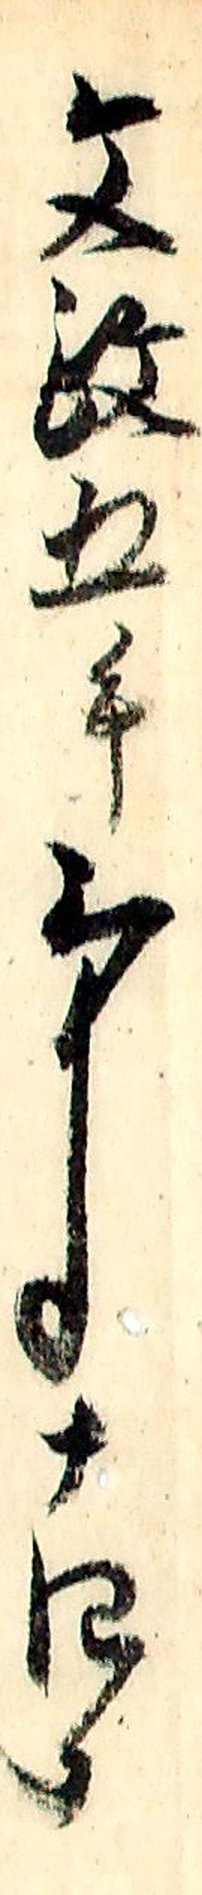文政五午三月十四日

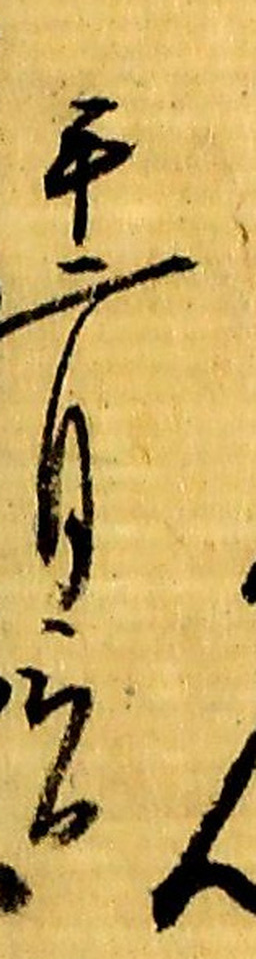午二月三日
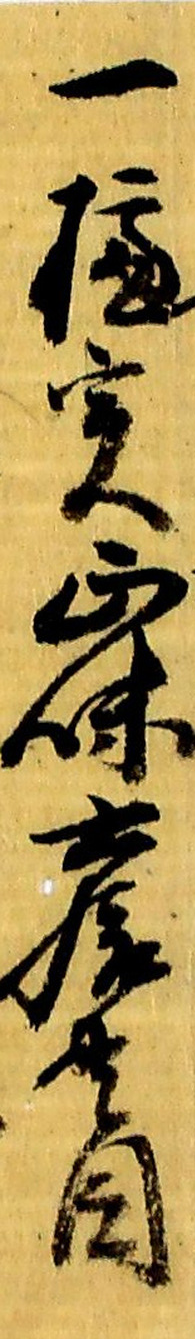一櫨実正味六拾貫目
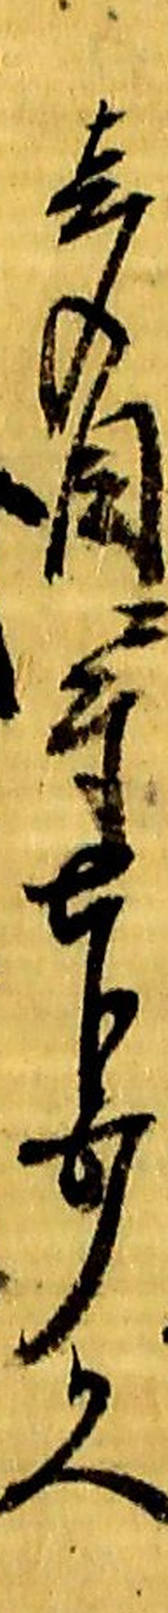壱〆目に付七分五りかへ
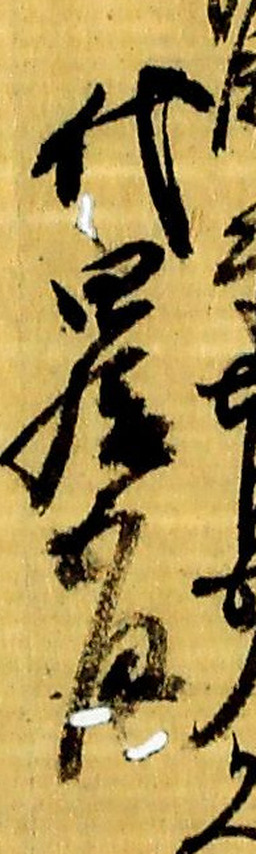代四拾五匁
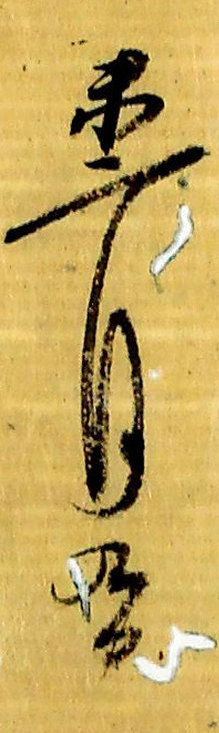未二月九日
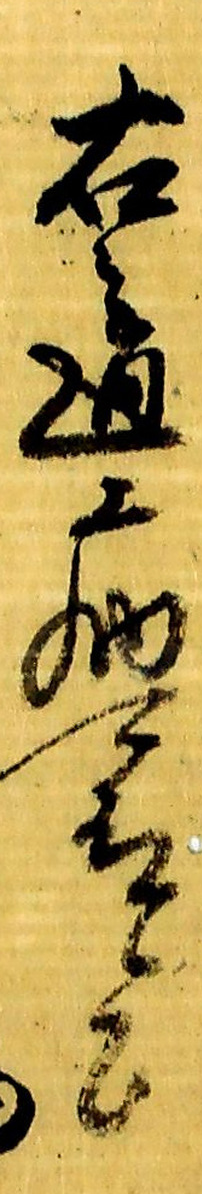右之通上納可有候以上
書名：乍恐奉願上覚（御国産櫨植付並実取集売捌等)他
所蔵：鳴門教育大学 Naruto University of Education
